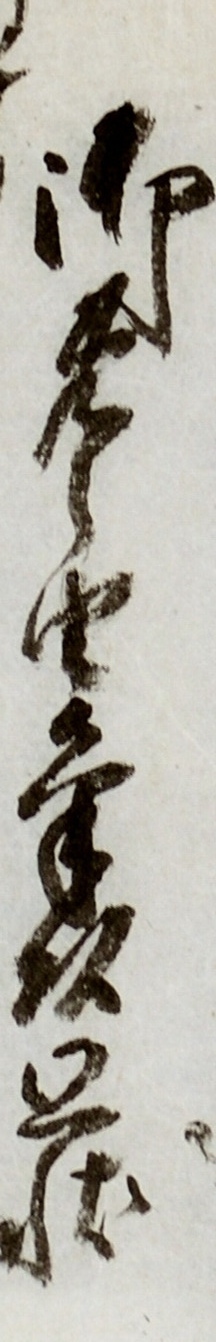御免之由筆頭廻状
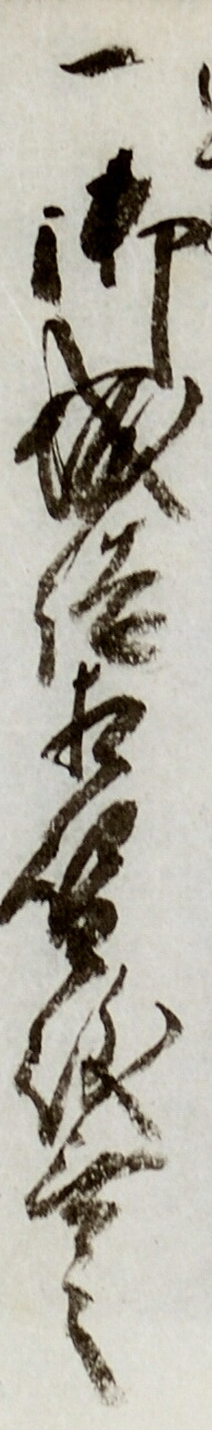一御城詰相替儀無之
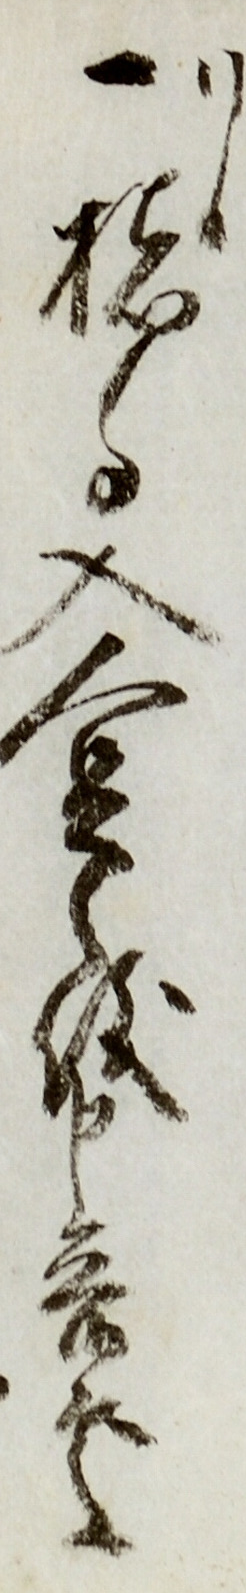一楮手入人足之儀申立候処
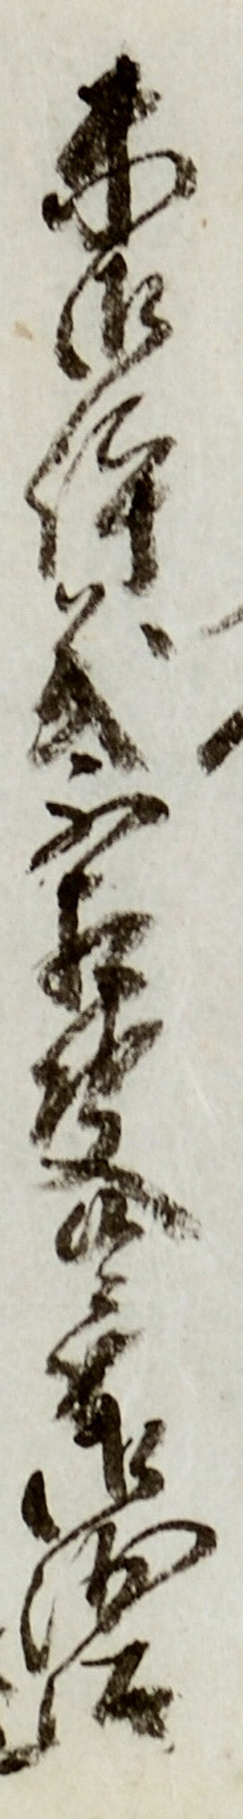未御評義不相決候に付御沙汰之上
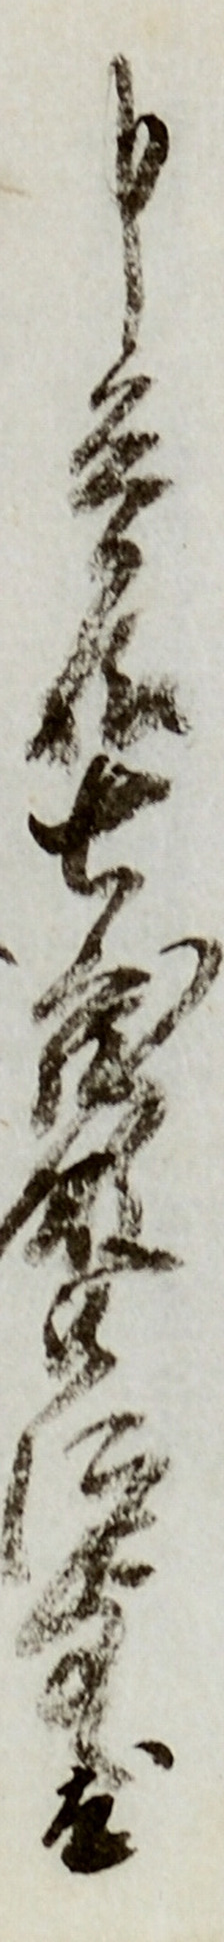申立候様七蔵殿被仰聞候尤
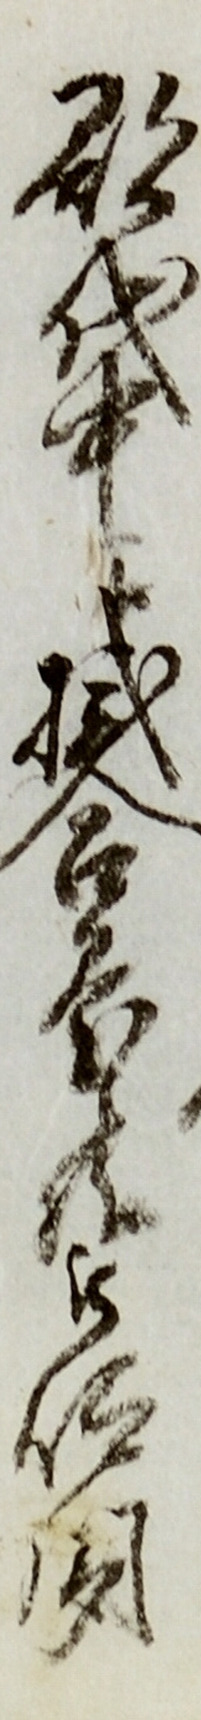郡代中掛合置候様被仰聞
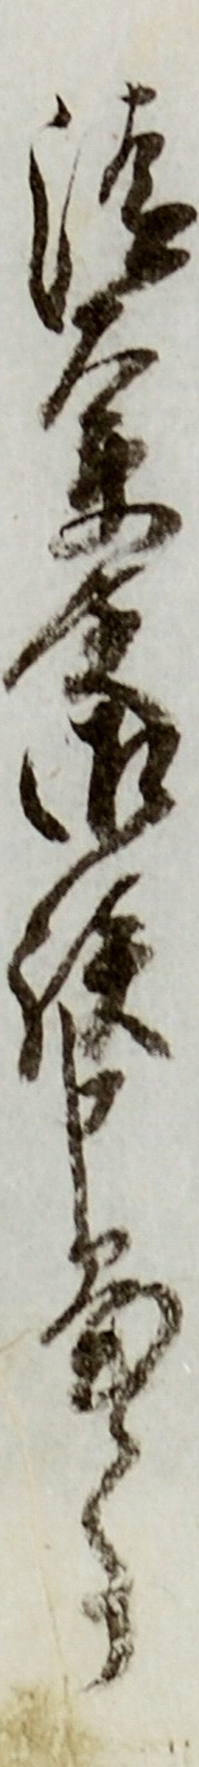清大夫殿御談申置候事
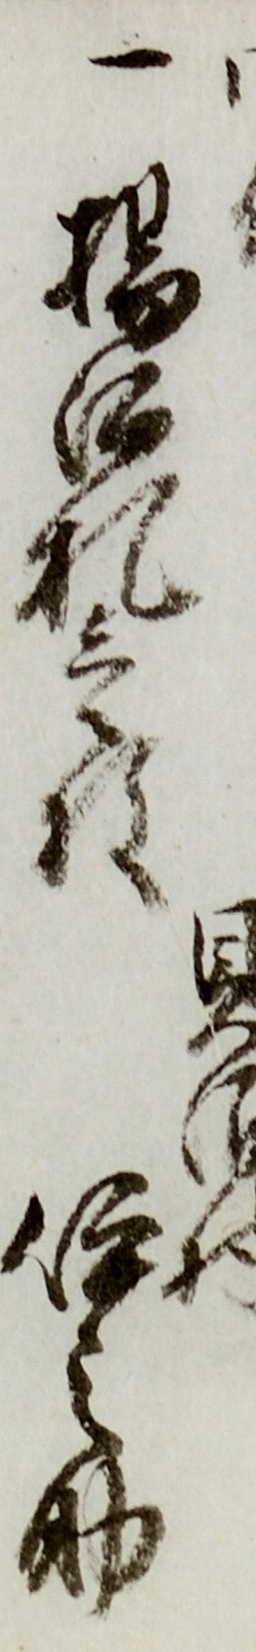一揚酒札壱枚伊之助
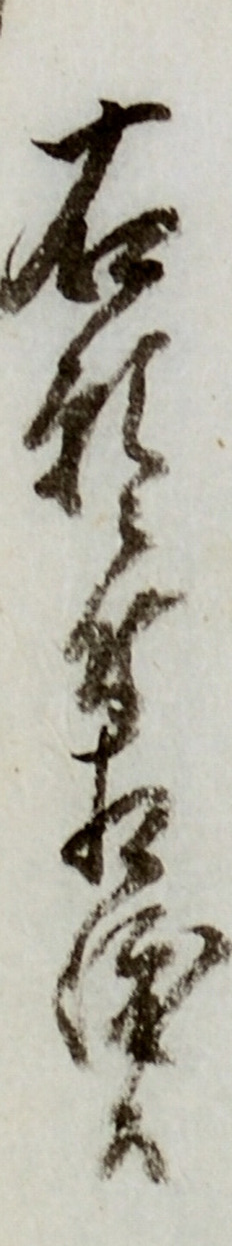右願に付相渡候
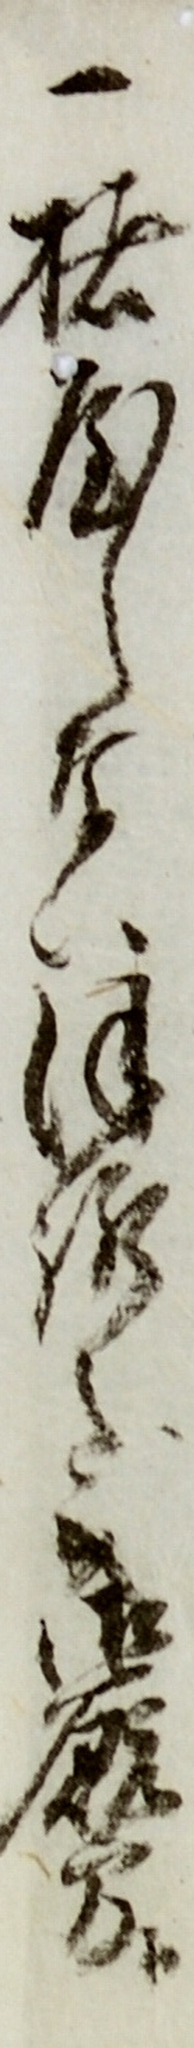一楮やしないほろ之義御厩方え
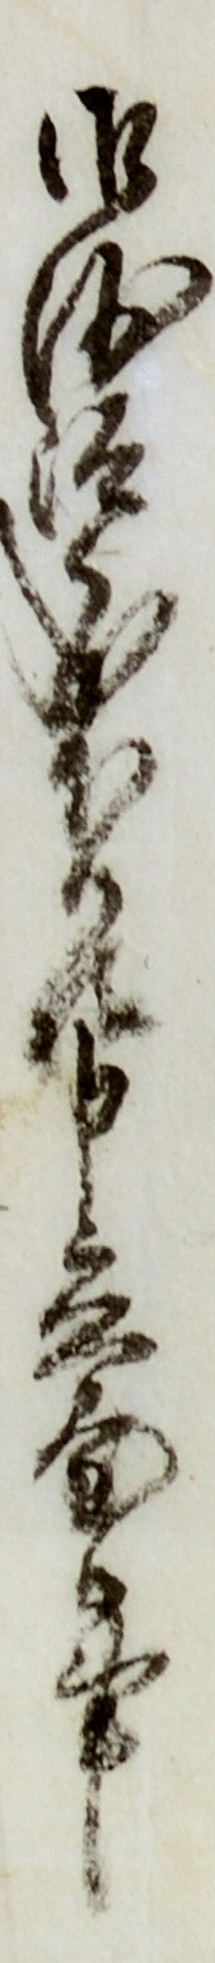御沙汰被成下候様申立置候事
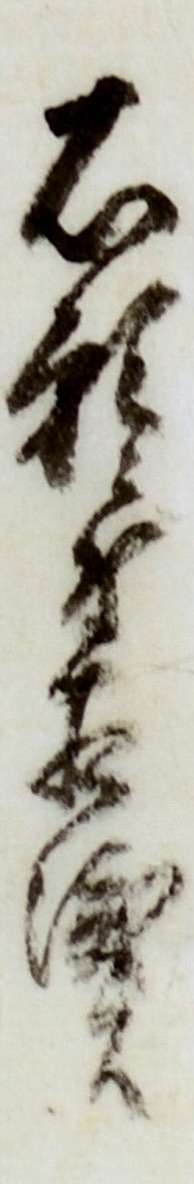右願に付相渡候

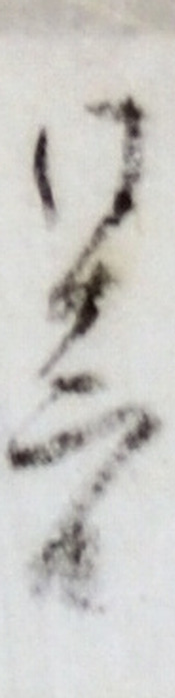同十一日
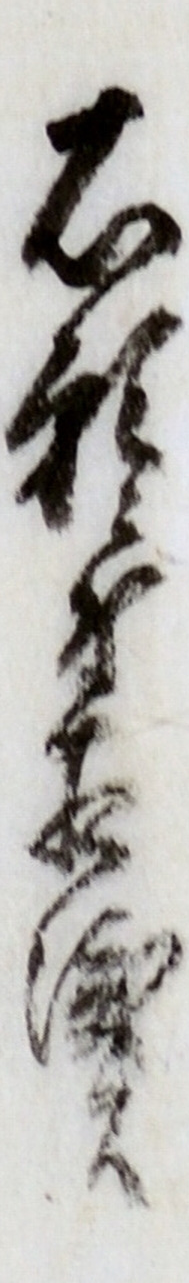右願に付相渡候
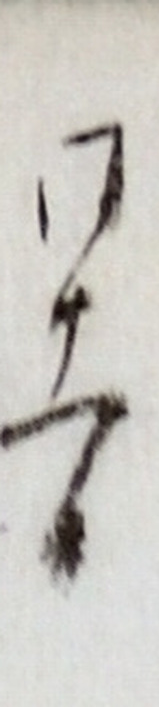同十一日
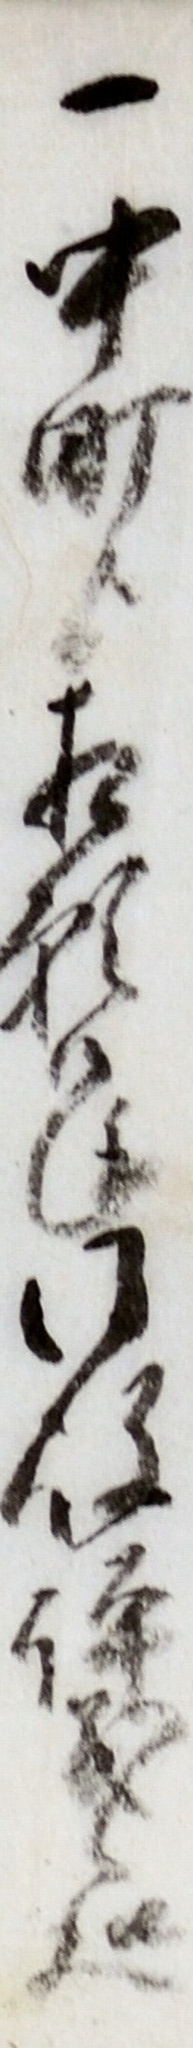一中町より相願候趣同役評義候処
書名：諸事御用留帳
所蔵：伊那市立高遠町図書館・合同会社AMANE
